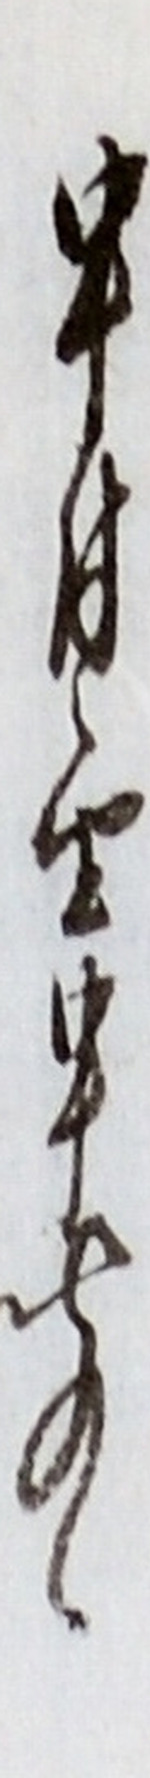申付候由申聞候
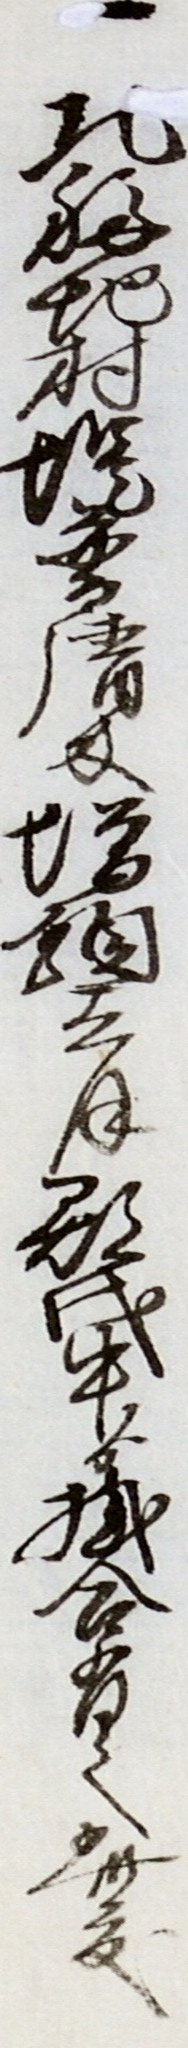一北福地村境普請木増願去月郡代中より掛合有之此度
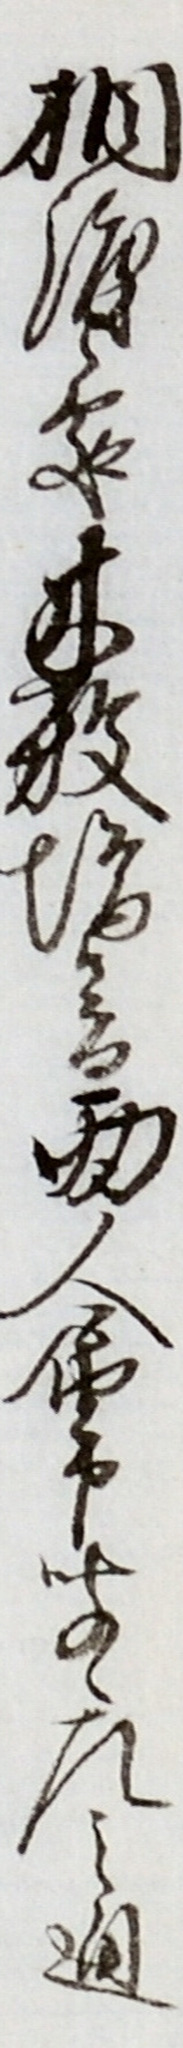相渡候処木数増候ニ而両人届申聞候左之通
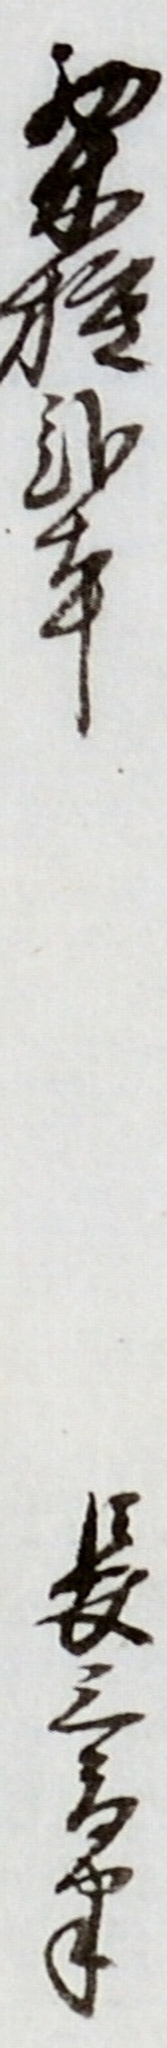栗種弐本長三間半
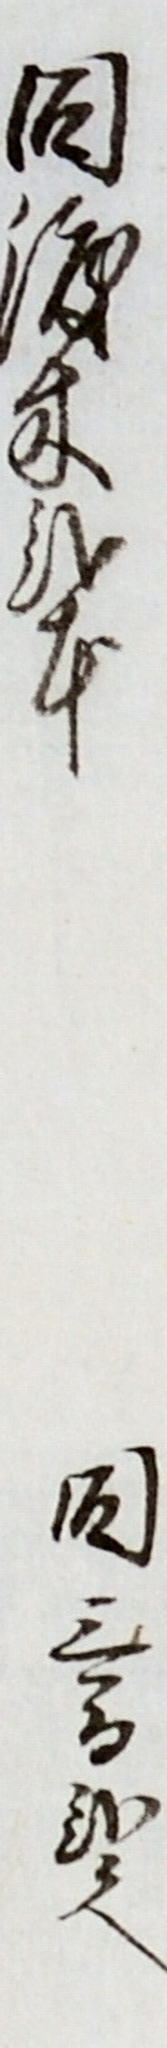同渡木弐本同三間弐尺
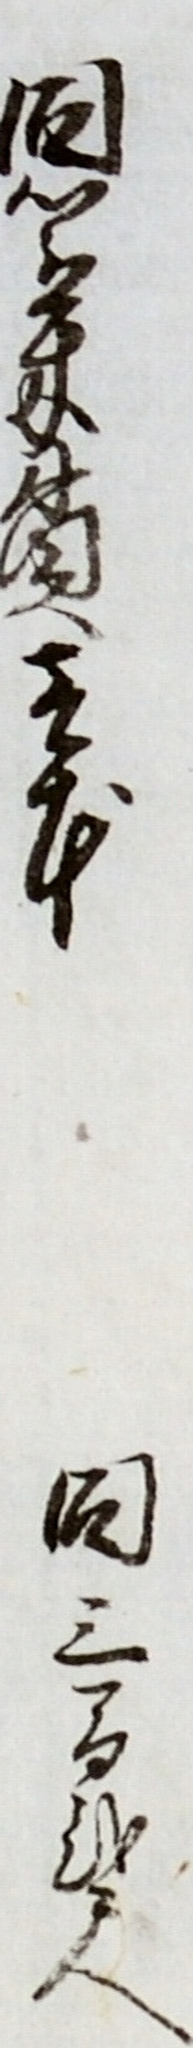同渡木弐本同三間弐尺
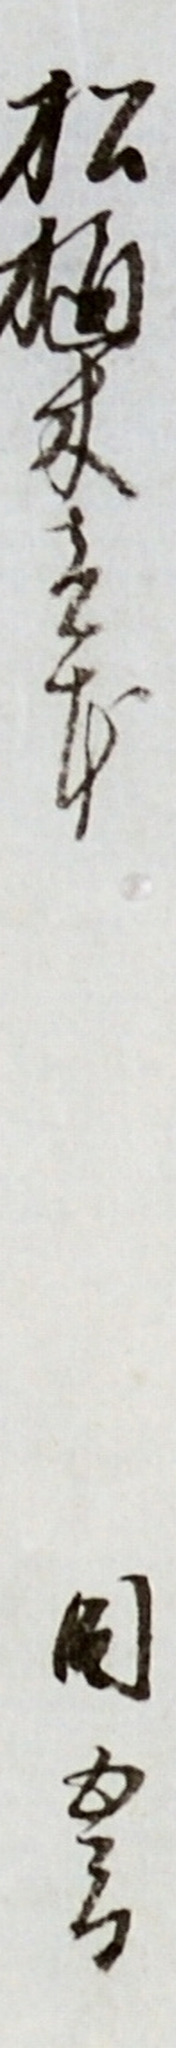松樋木負壱本同五間
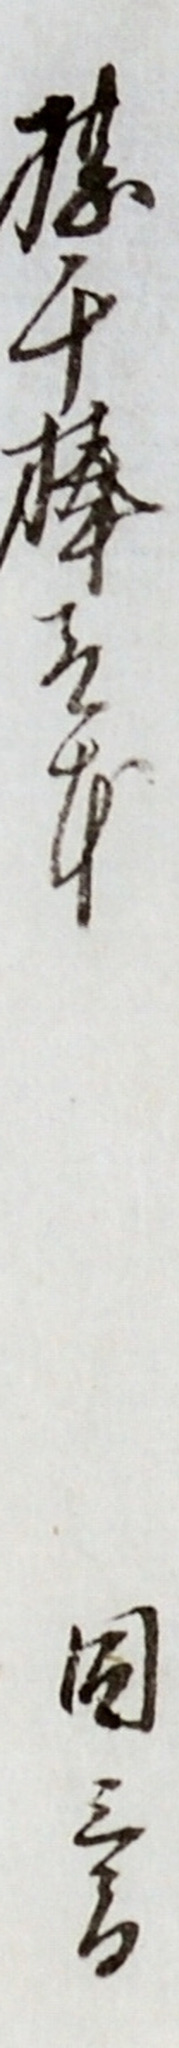椹千棒壱本同三間
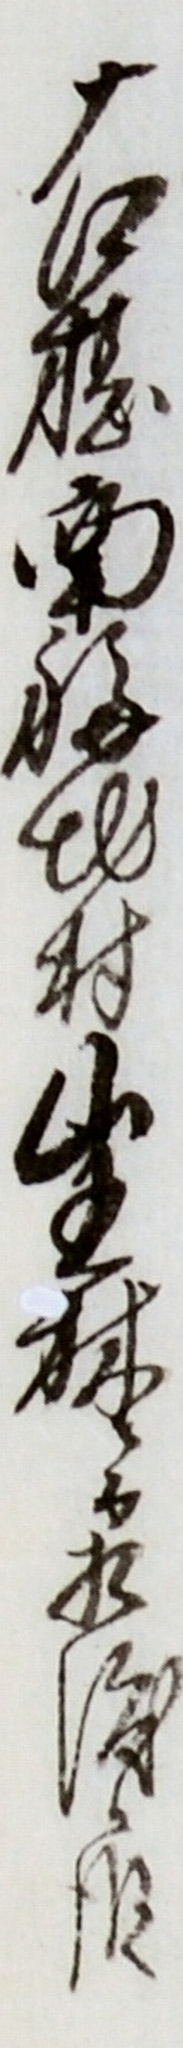右椹南福地村山王林ニて相渡候段

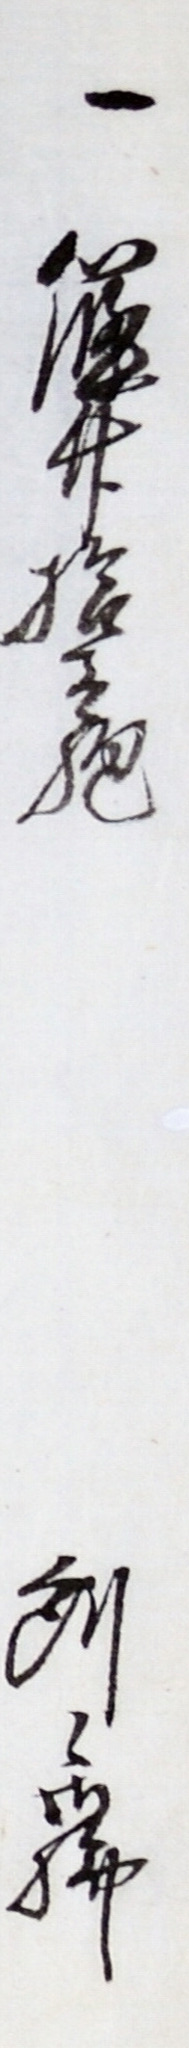一篠竹拾壱把所々御払
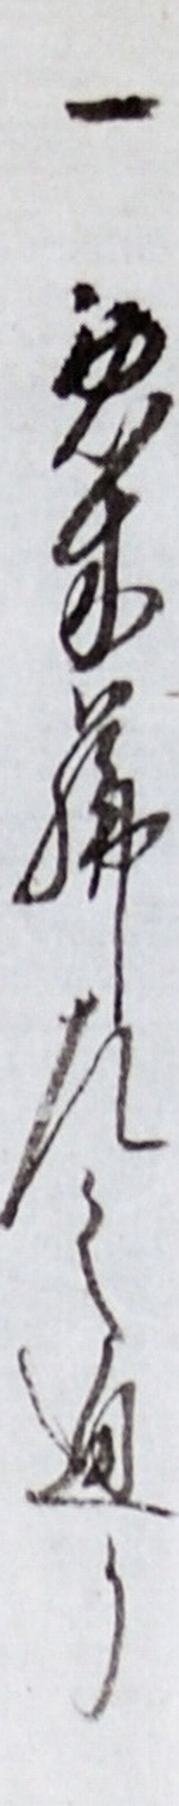一惣木篠左之通
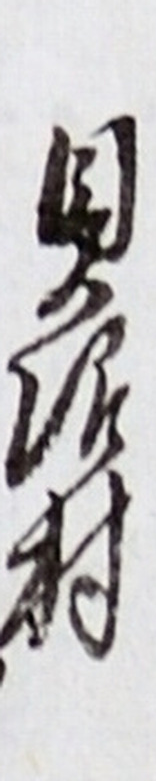貝沼村
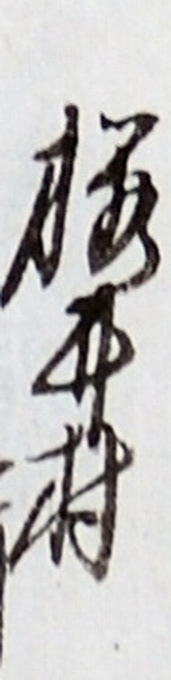桜井村
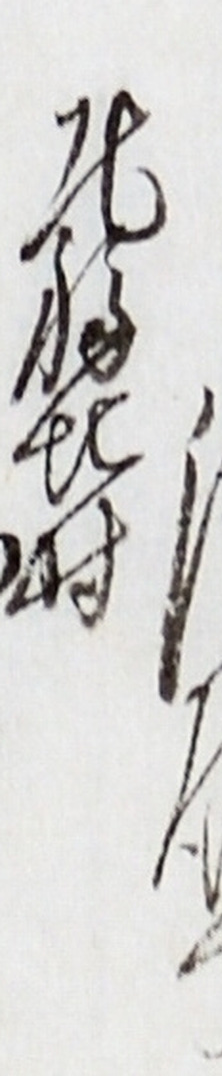北福地村
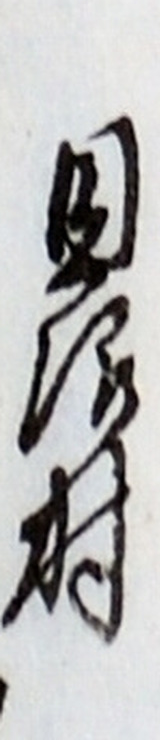貝沼村
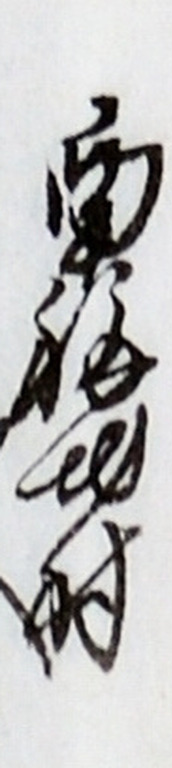南福地村
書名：御山奉行御用控
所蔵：伊那市立高遠町図書館・合同会社AMANE
